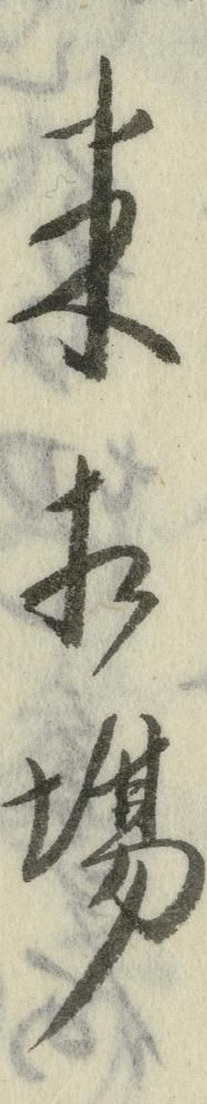米相場
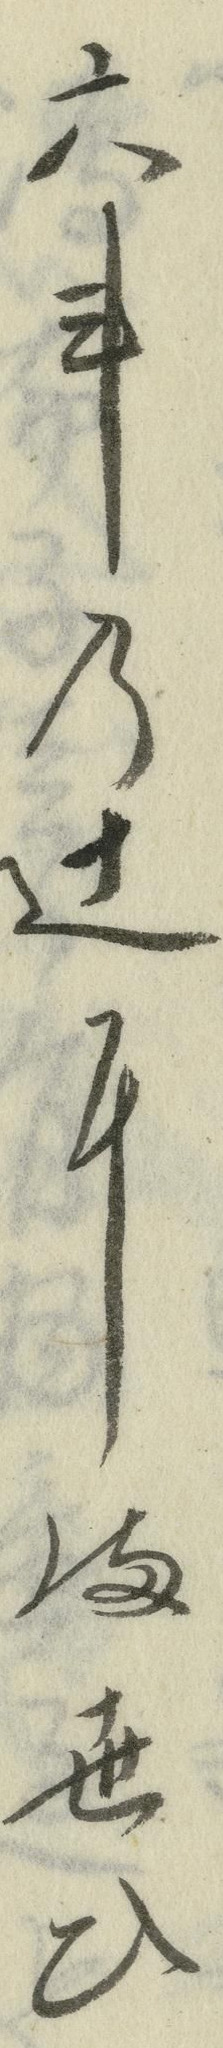六斗の辻に満世ひ
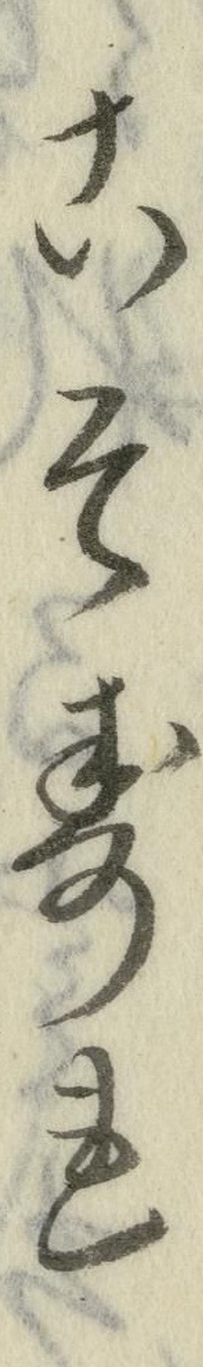こそすれ
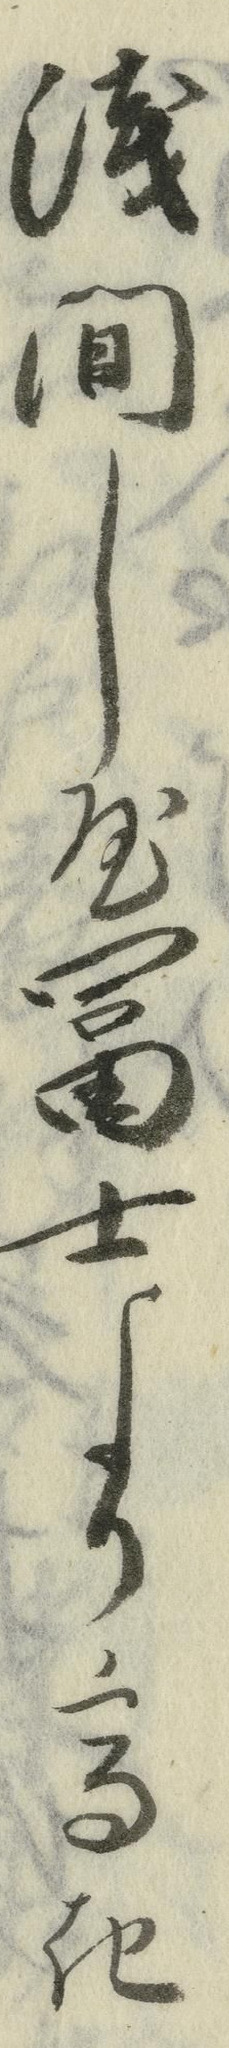浅間し屋富士より高起
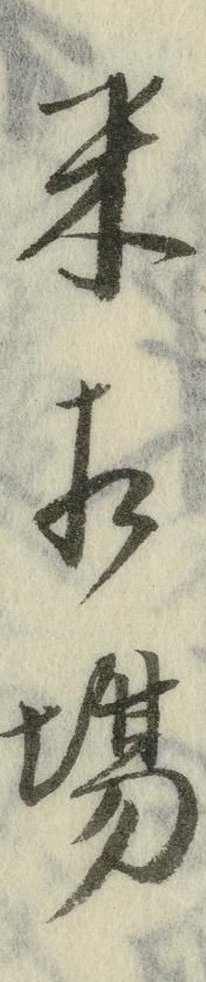米相場
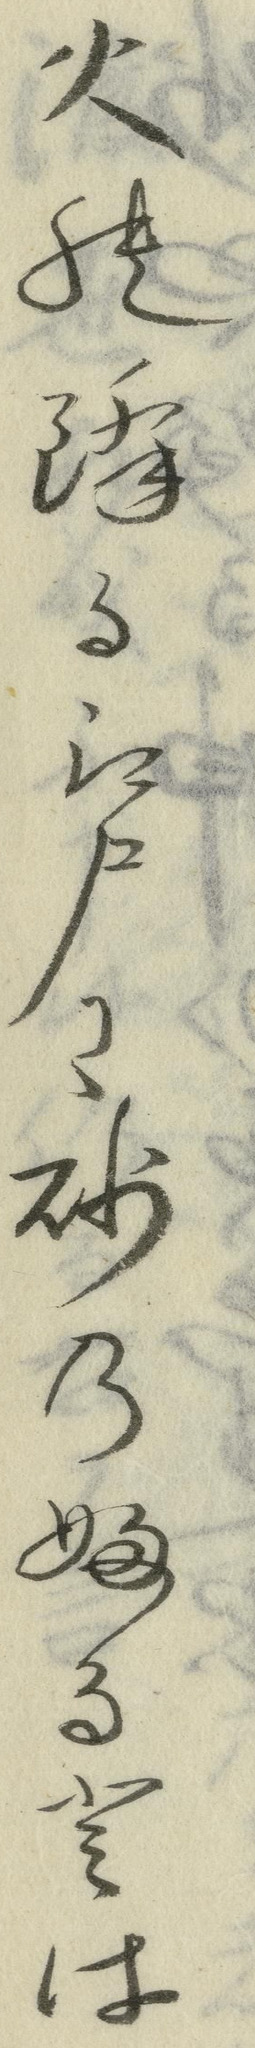火の降る江戸に砂のふるとは

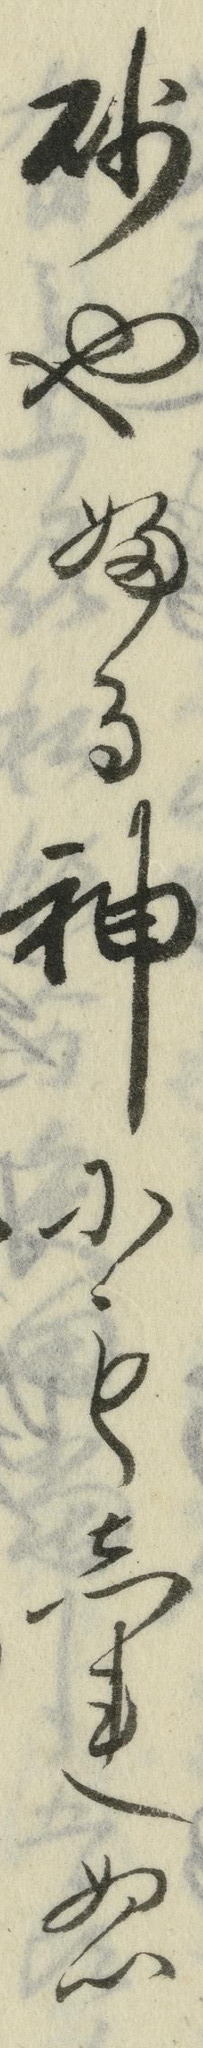砂やふる神にもしれぬ
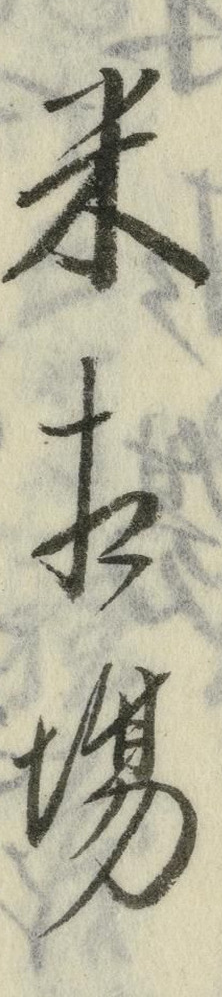米相場
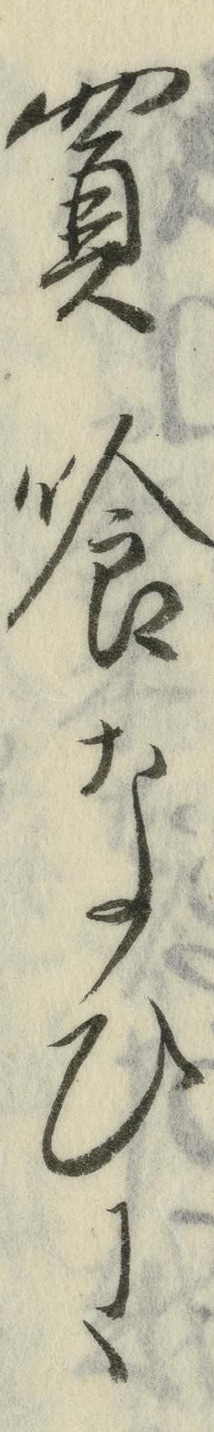買喰なひに
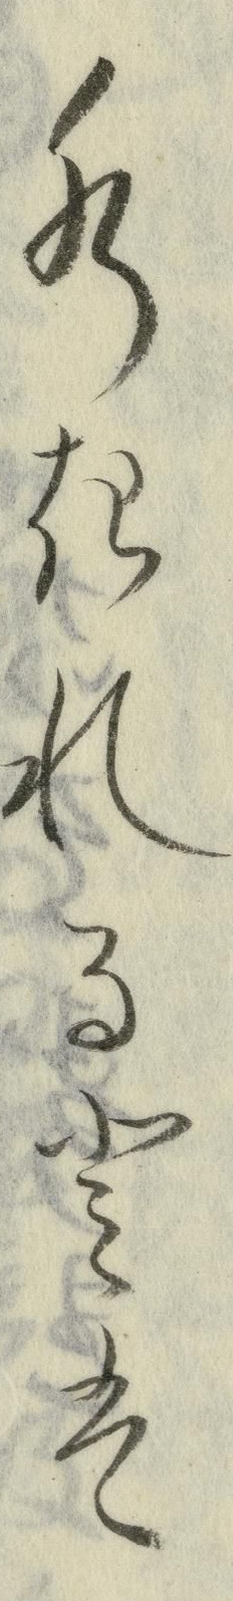水きれるとは
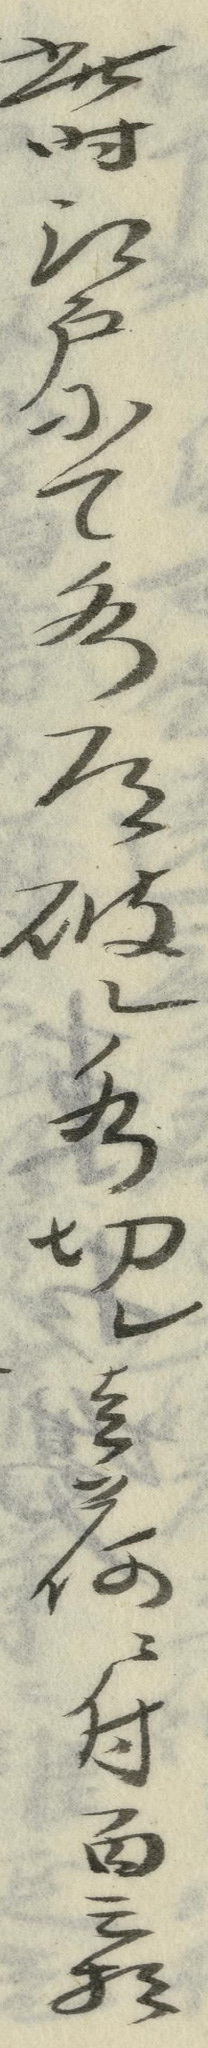此時江戸にて水道破レ水切レ壱荷ニ付百三拾
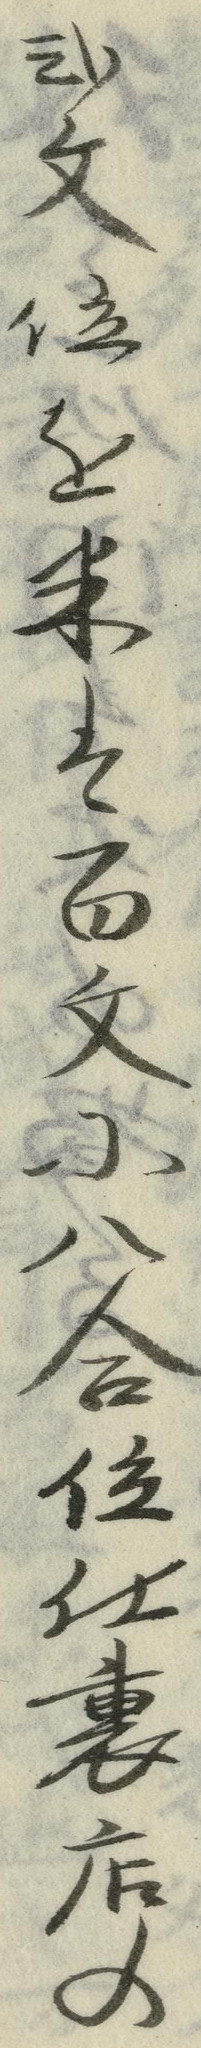弐文位を米は百文に八合位仕裏店の
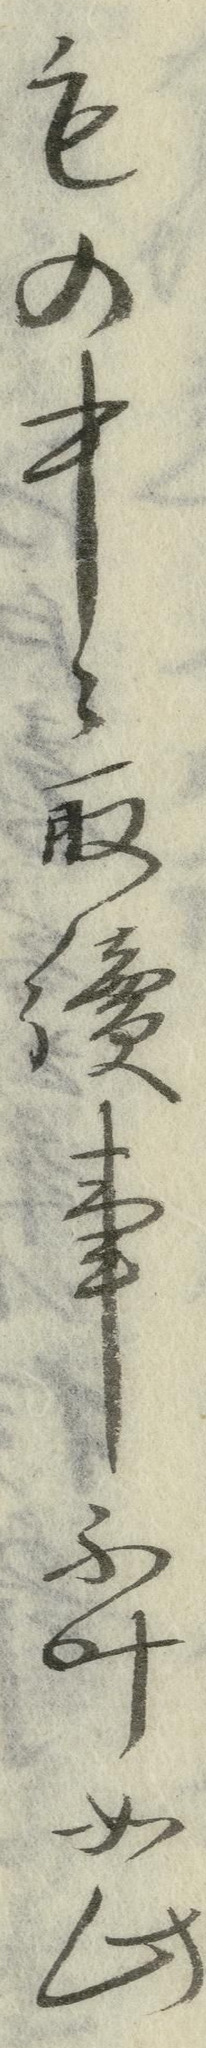もの中々取続事不叶如此
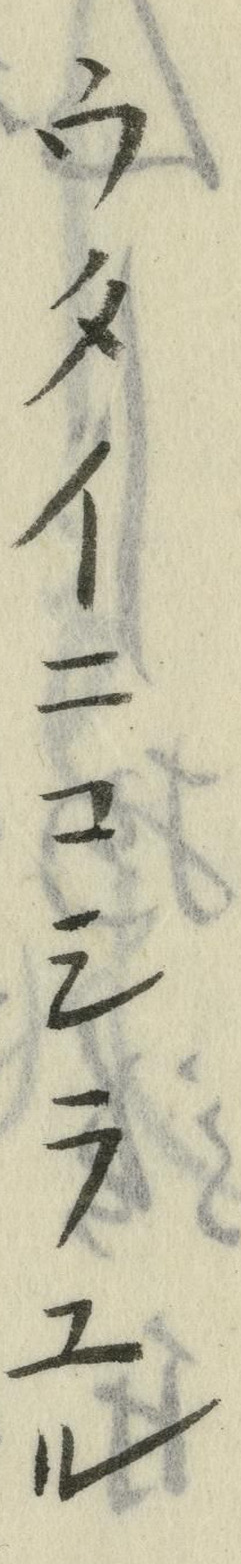ウタイニコシラユル
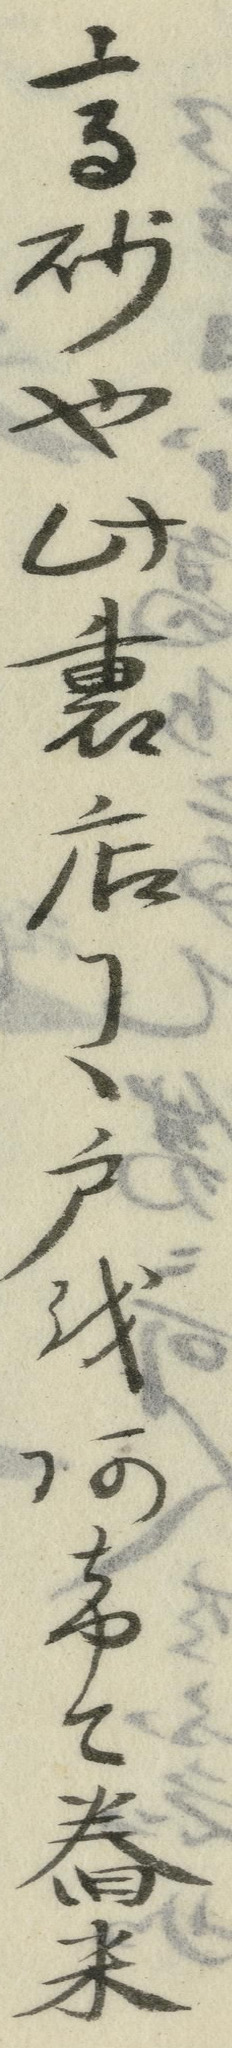高砂や此裏店に戸をあけて舂米
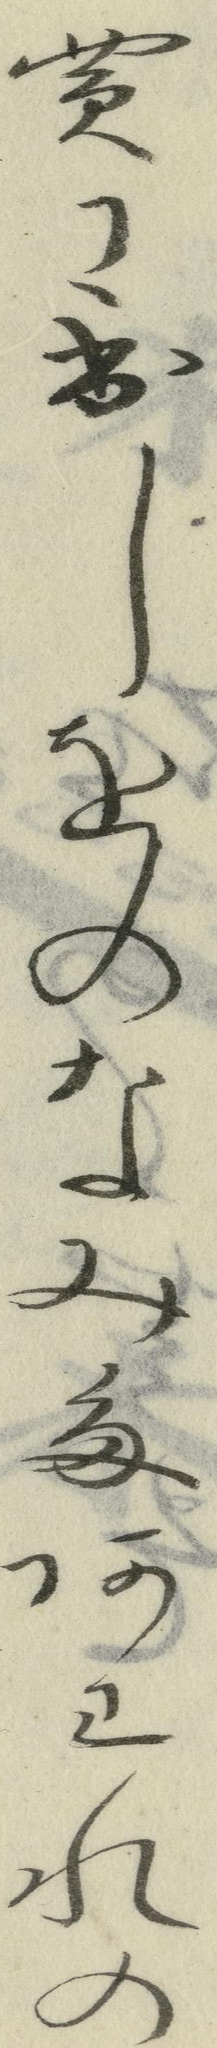買に出しをのなみたあわれの
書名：天明三癸卯七月信州浅間山焼出シ上州山津浪ニ付近國ヨリ御届書并訴書写
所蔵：東京大学地震研究所図書室 Earthquake Research Institute Library, The University of Tokyo, JAPAN
